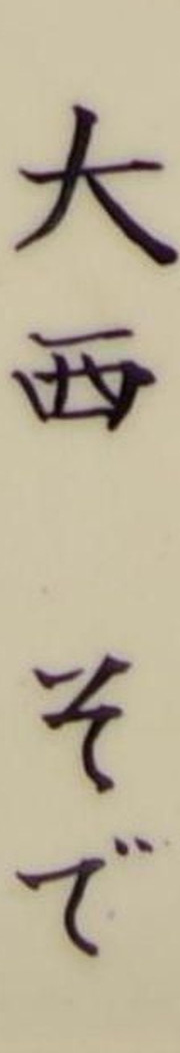大西そで
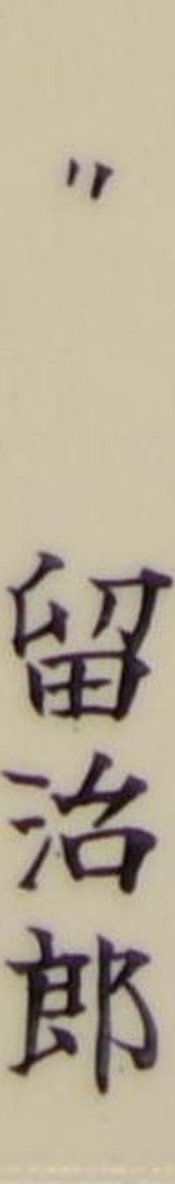留治郎
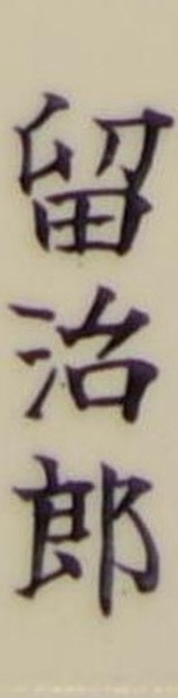留治郎
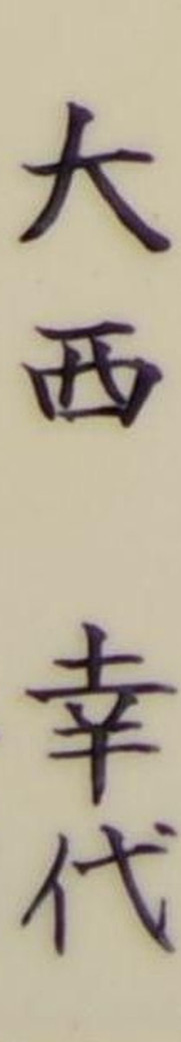大西幸代

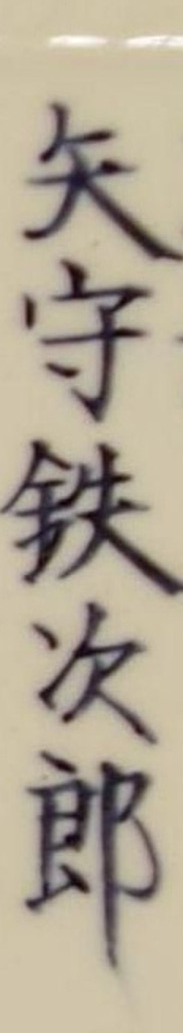矢守鉄次郎
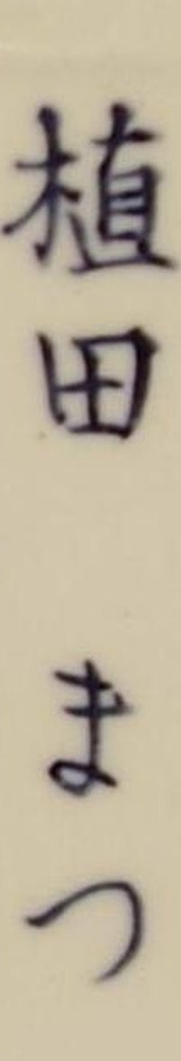植田まつ
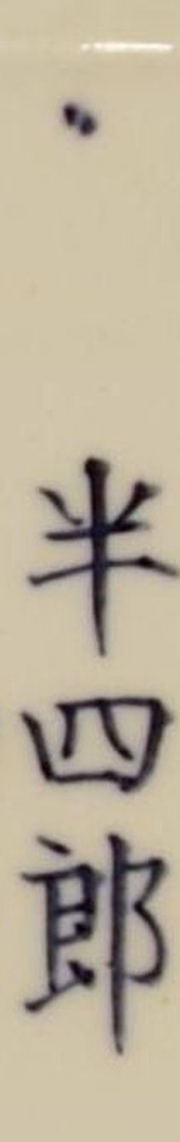半四郎
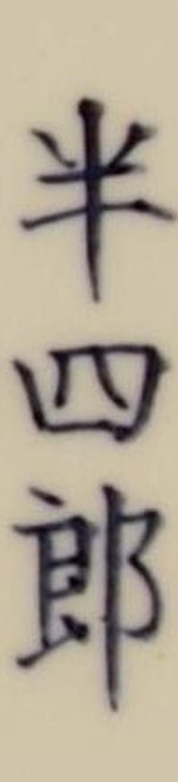半四郎
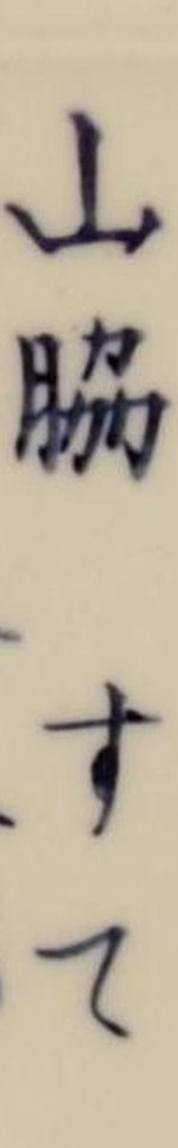山脇すて
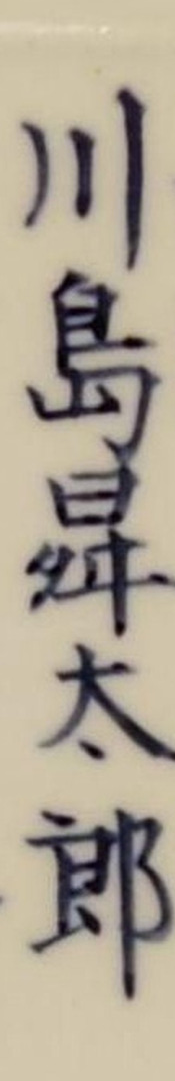川島昇太郎
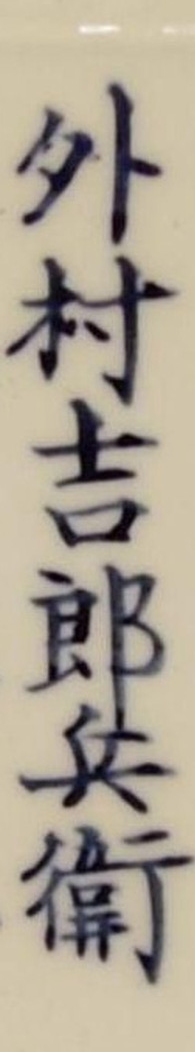外村吉郎兵衛
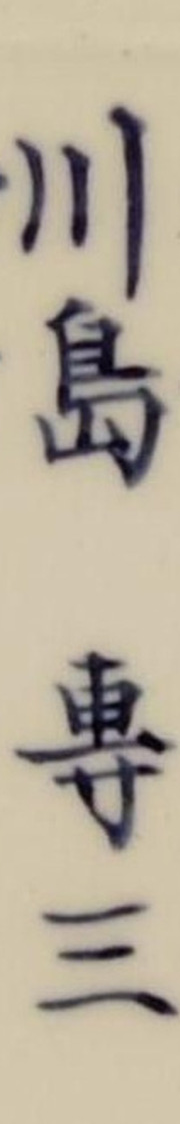川島専三
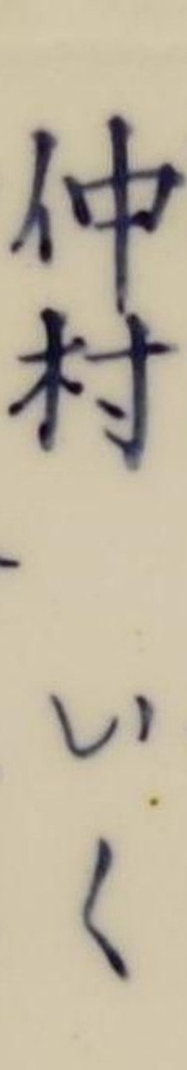仲村いく
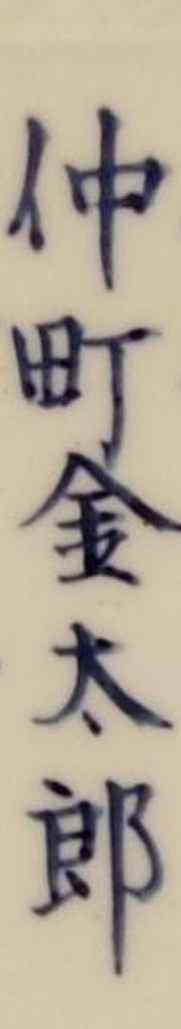仲町金太郎
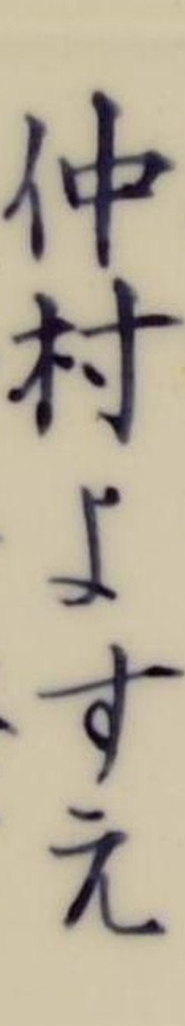仲村よすえ
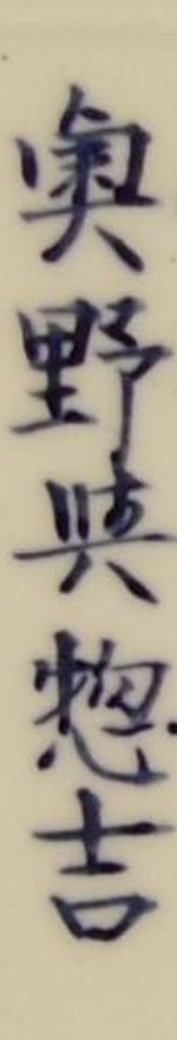奥野与惣吉
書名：E~L
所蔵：高野山金剛峯寺
